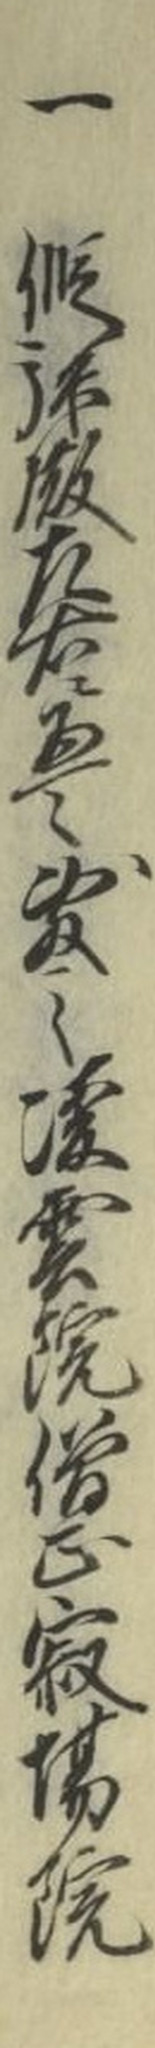一仮拝殿左右に畳敷之凌雲院僧正寂場院
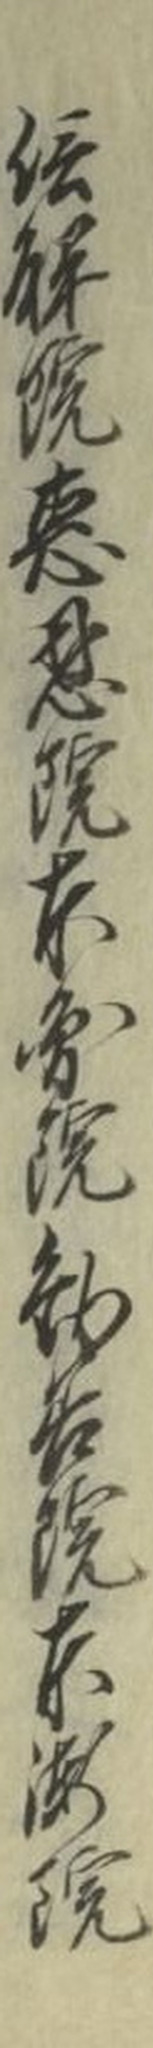信解院恵忍院本圓院勧善院本漸院
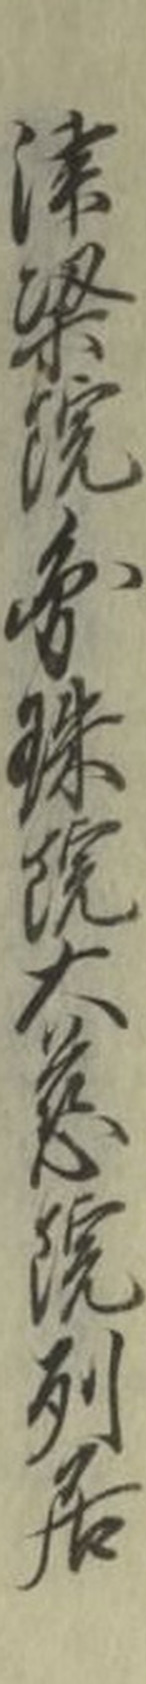津梁院圓珠院大慈院列居
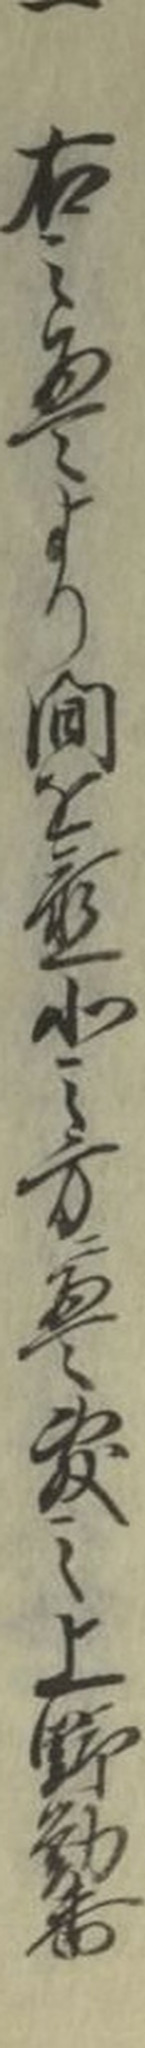一右之畳より間を置北之方に畳敷之上野勤番
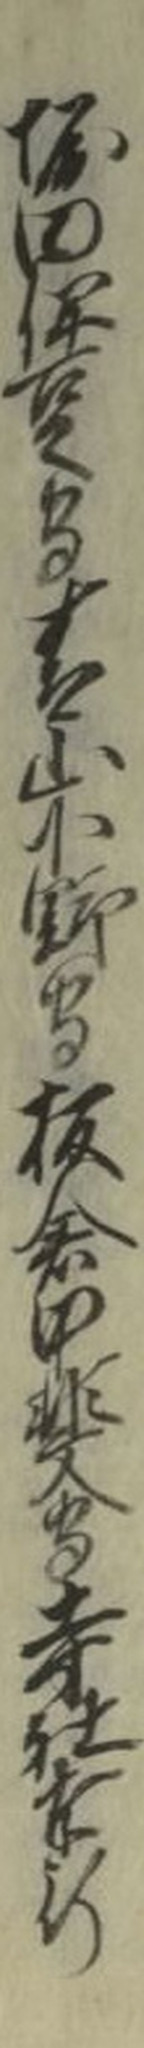堀田伊豆守青山下野守板倉甲斐守寺社奉行
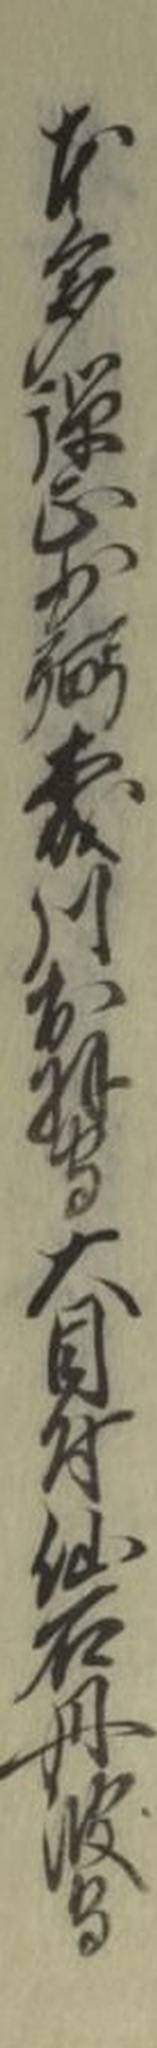本多弾正少弼森川出羽守大目付仙石丹波守

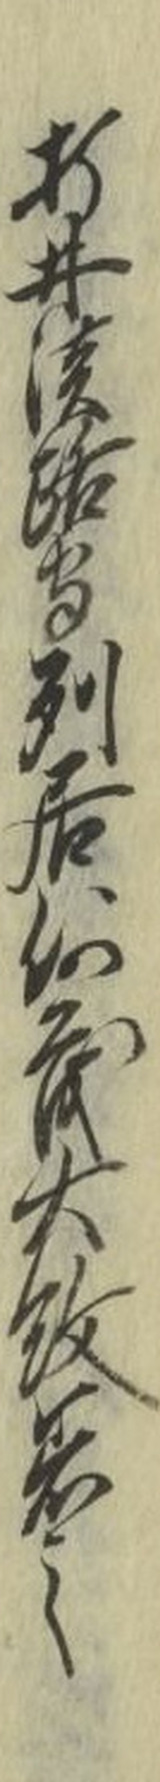折井淡路守列居何も大紋着之
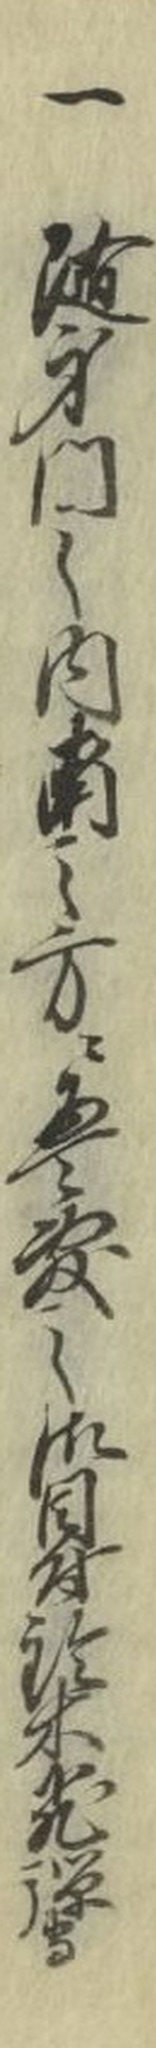一随身門之内南之方に畳敷之御目付鈴木飛騨守
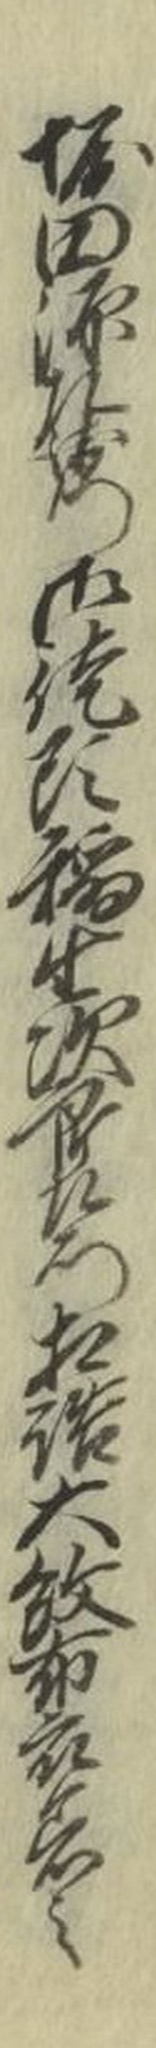堀田源左衛門御徒頭稲生次郎左衛門相詰大紋布衣着之
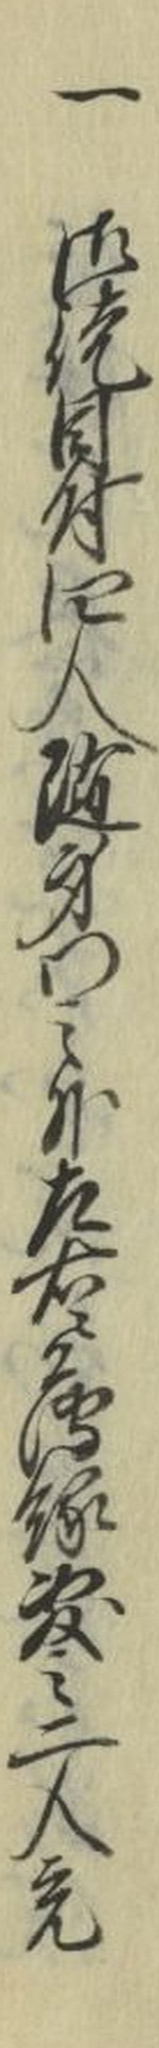一御徒目付四人随身門之外左右に薄縁敷之二人充
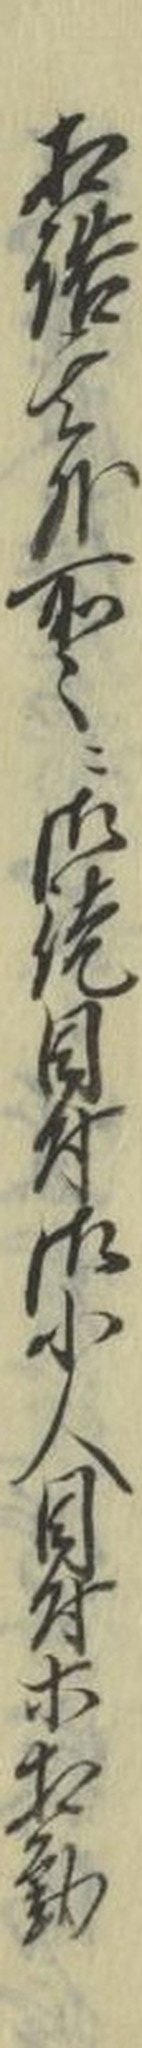相詰其外所々に御徒目付御小人目付等相勤
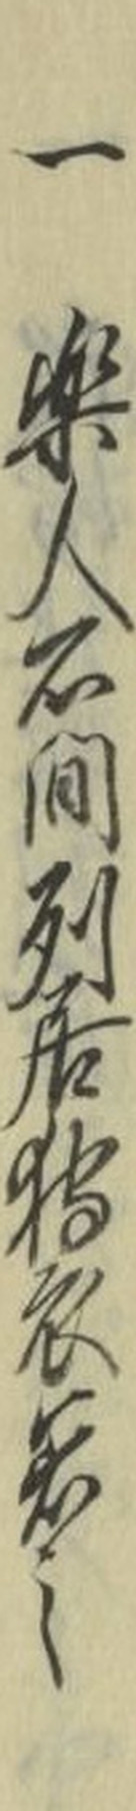一楽人石間列居狩衣着之
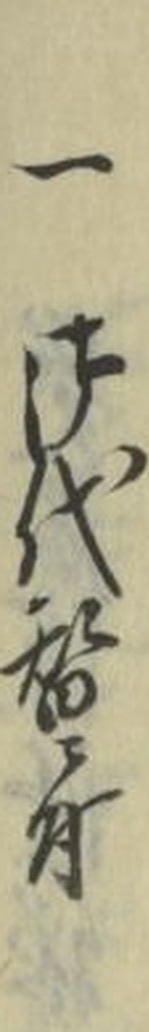一御代替に付
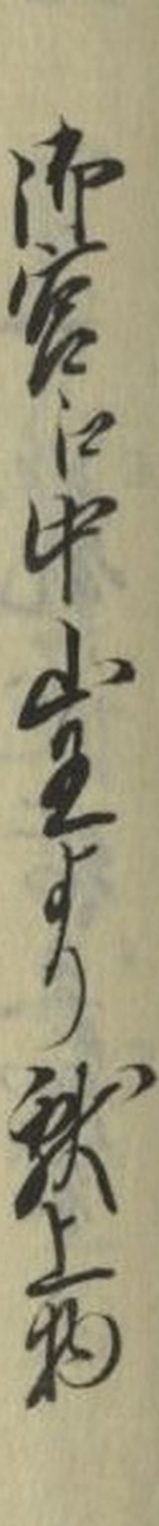御宮え中山王より献上物
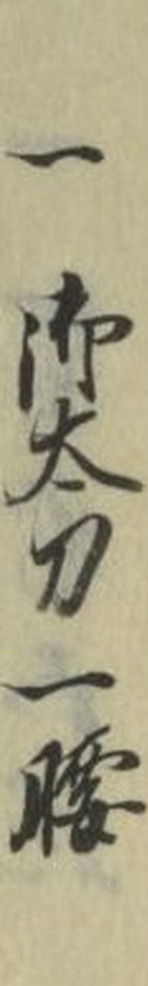一御太刀一腰
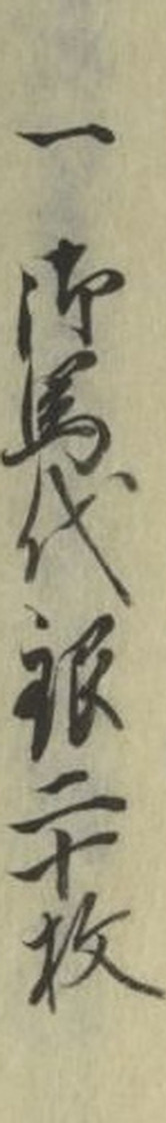一御馬代銀二十枚
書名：琉球人参府記
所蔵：University of the Ryukyus Library
